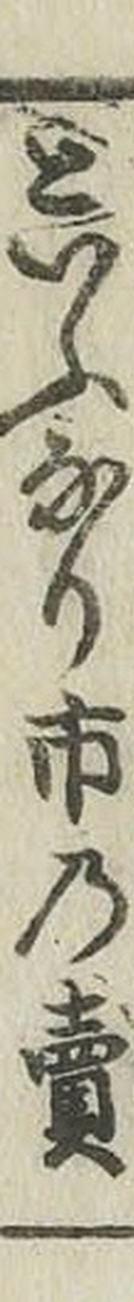といふなり市の売
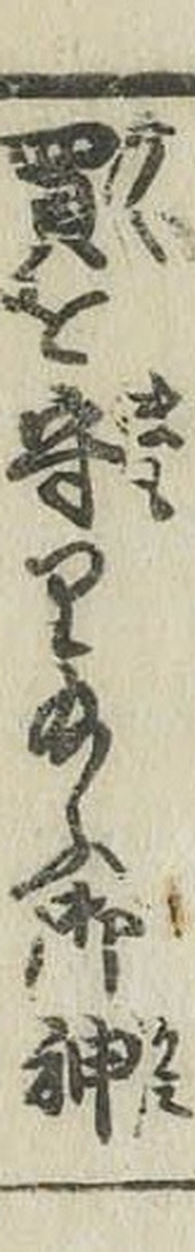買を守り給ふ御神

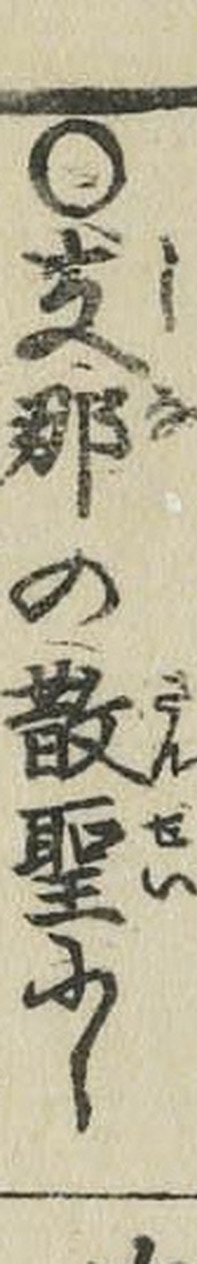○志那の散聖にし
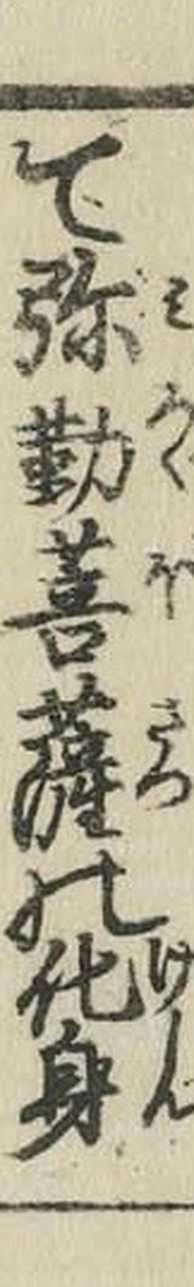て弥勒菩薩の化身
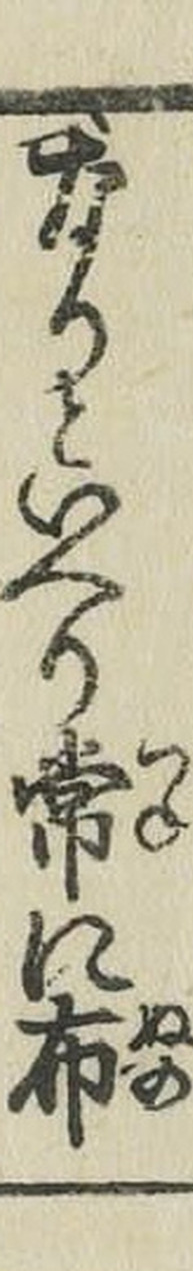なりといへり常に布
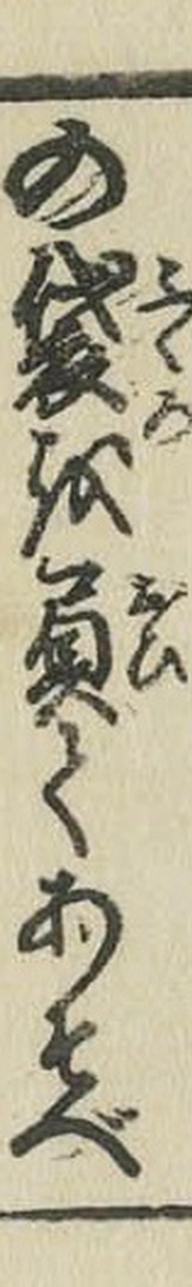の袋を負てあそべ
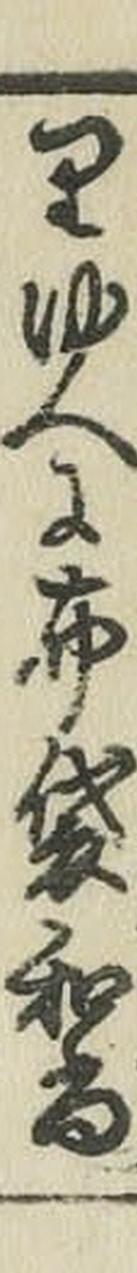りゆへに布袋和尚
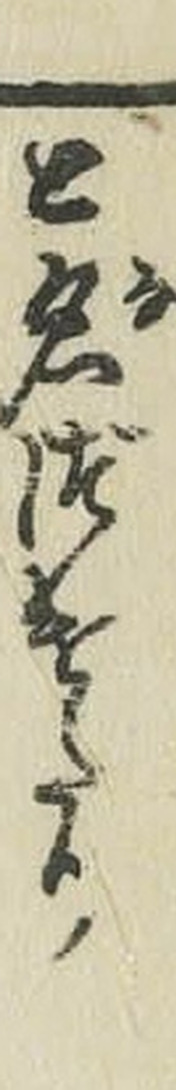と名ずけたり
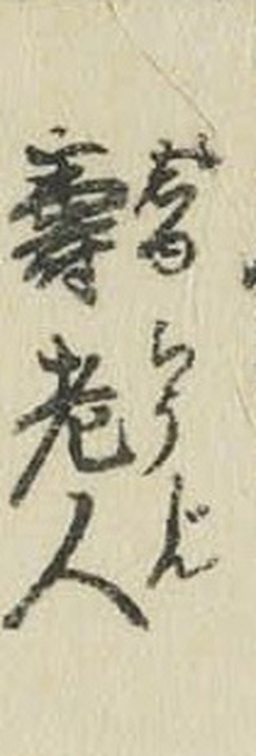寿老人
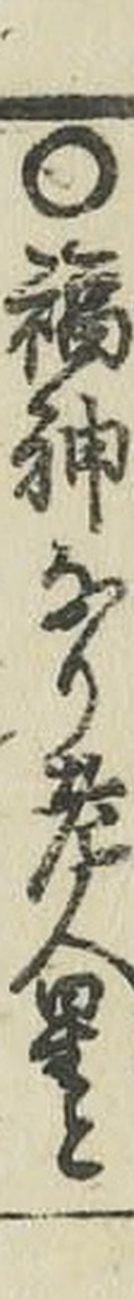○福神なり老人星と
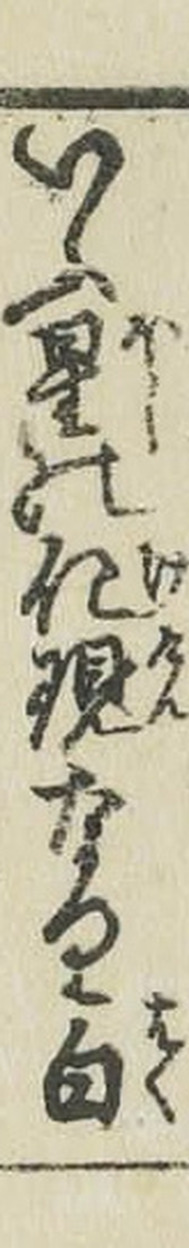いふ星の化現なり白
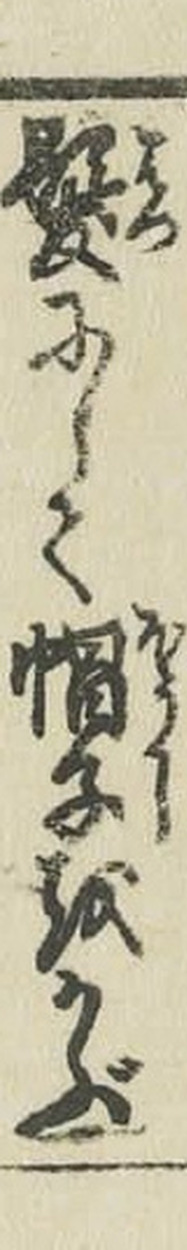髪にして帽子をかぶ
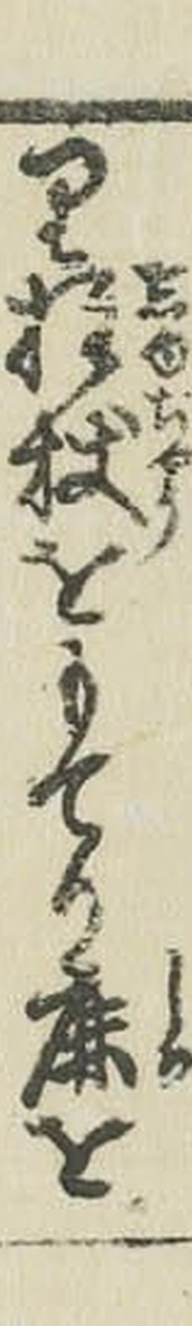り拄杖をもてり鹿を
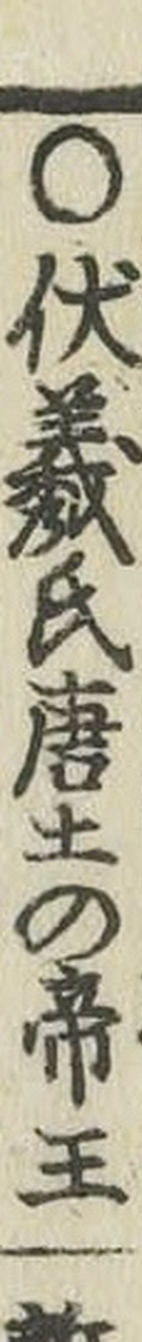○伏羲氏唐土の帝王
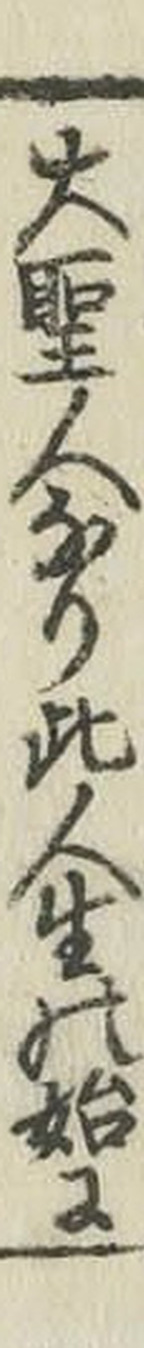大聖人なり此人生の始に
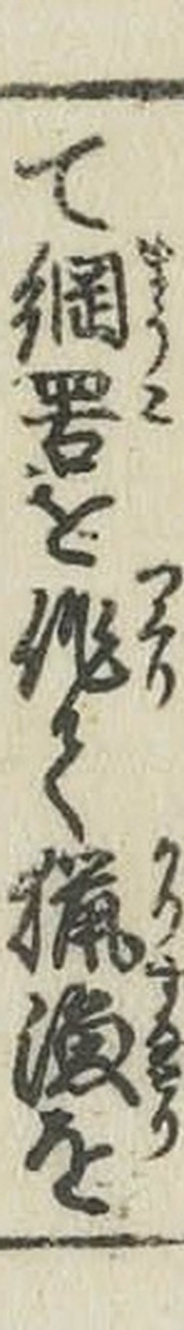て網罟を作て猟漁を
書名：増補頭書訓蒙図彙大成 10巻 10:巻之21
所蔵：東京学芸大学教育コンテンツアーカイブ
